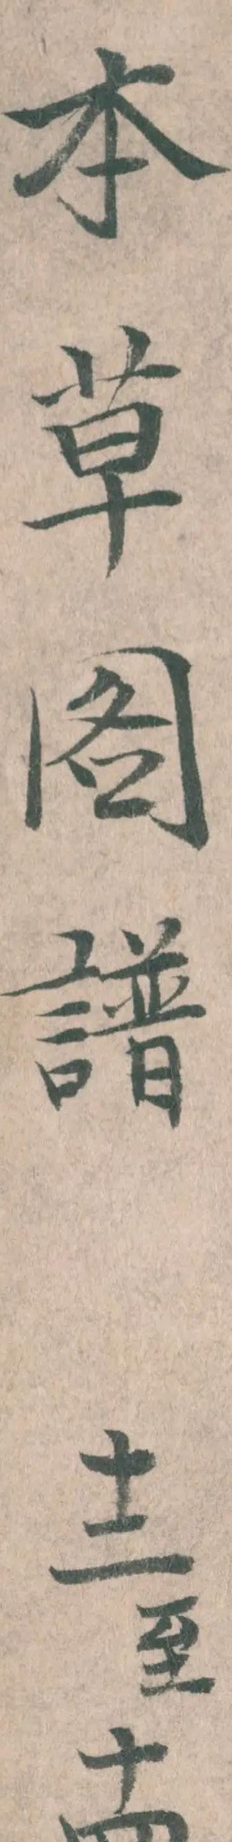本草図譜十二至十四

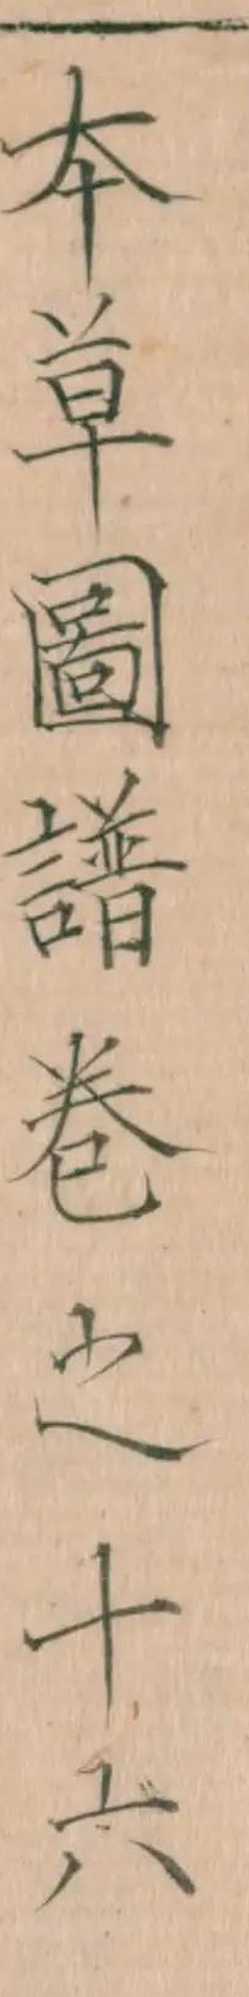本草図譜巻之十六
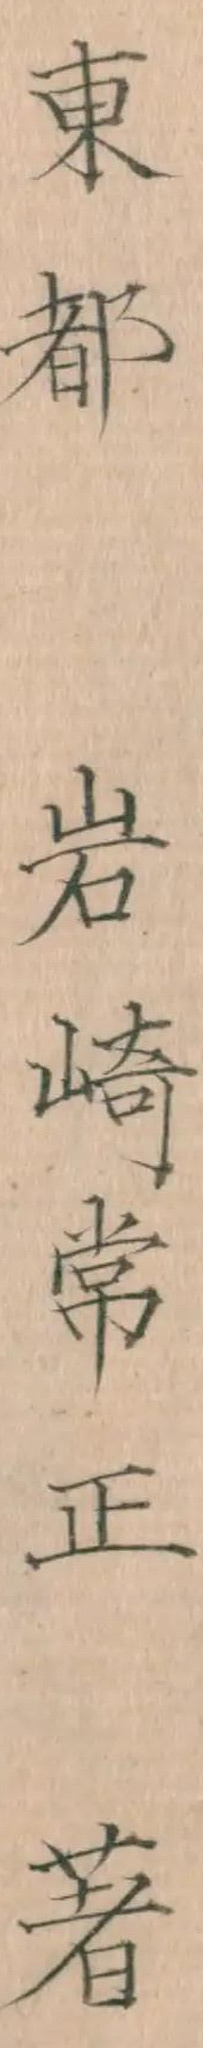東都岩崎常正著
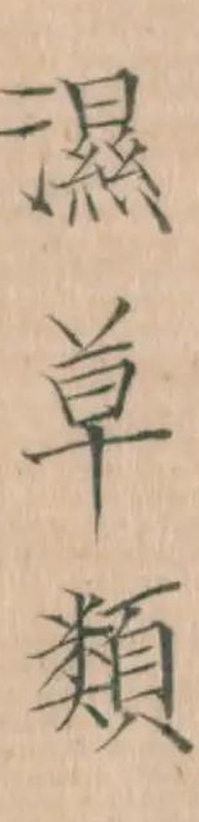濕草類

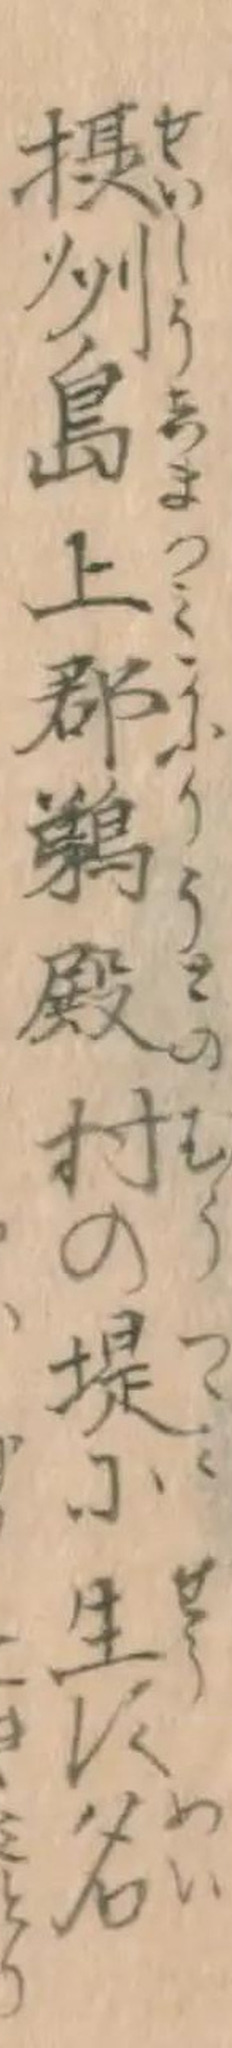摂州島上郡鵜殿村の堤に生す名
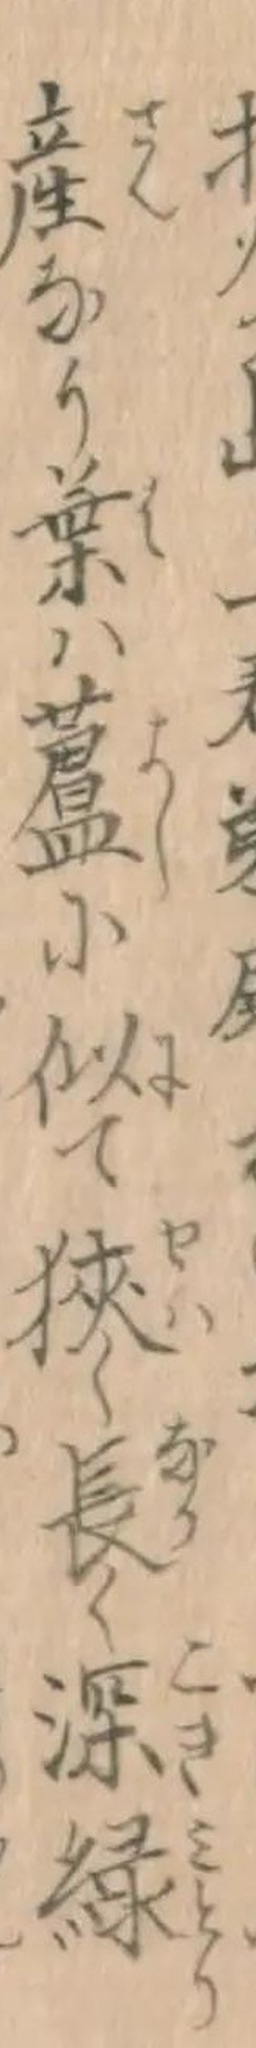産なり葉は蘆に似て狹く長く深緑
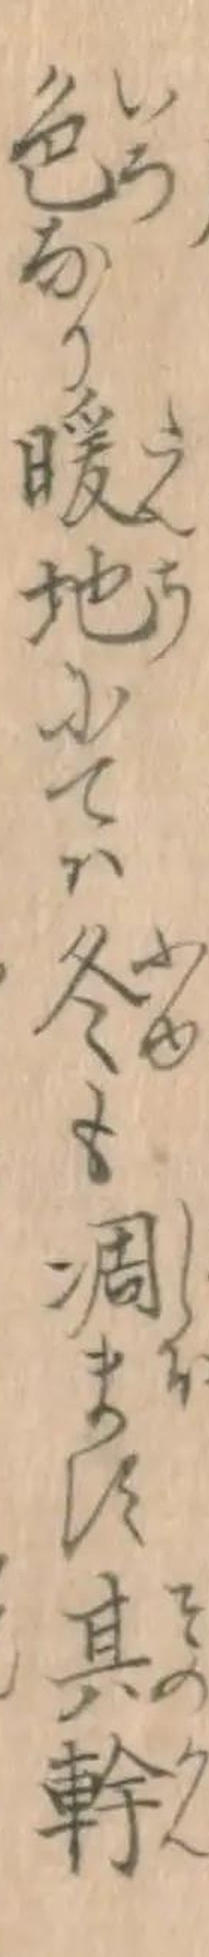色なり暖地にては冬も凋ます其幹
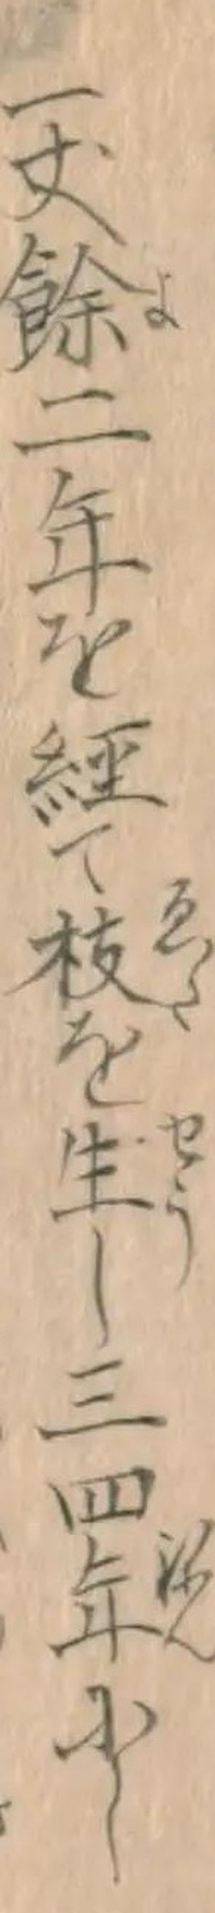一種一丈餘二年を経て枝を生し三四年にし
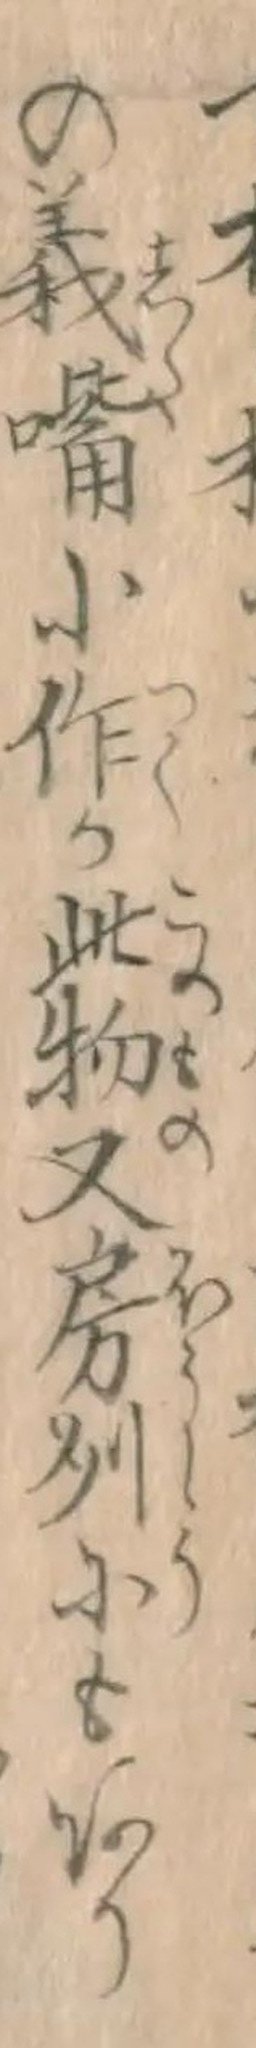の義嘴に作る此物又房州にもあり
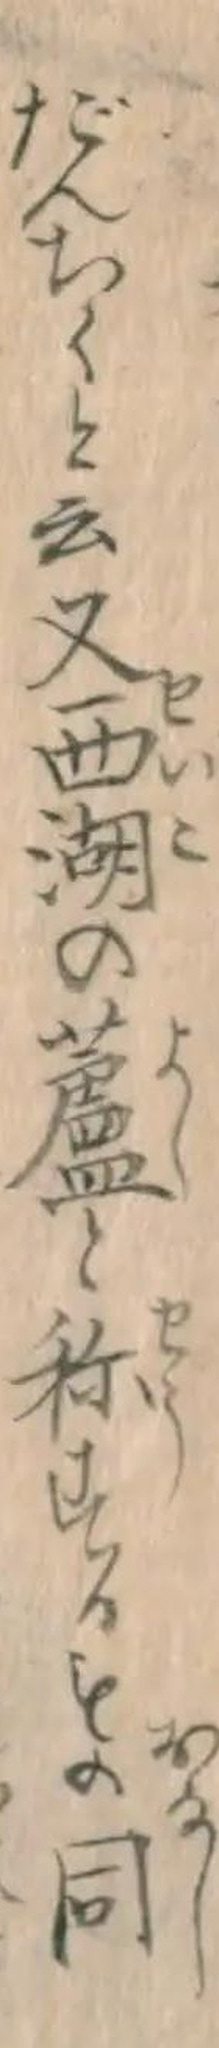だんちくと云又西湖の蘆と称するもの同
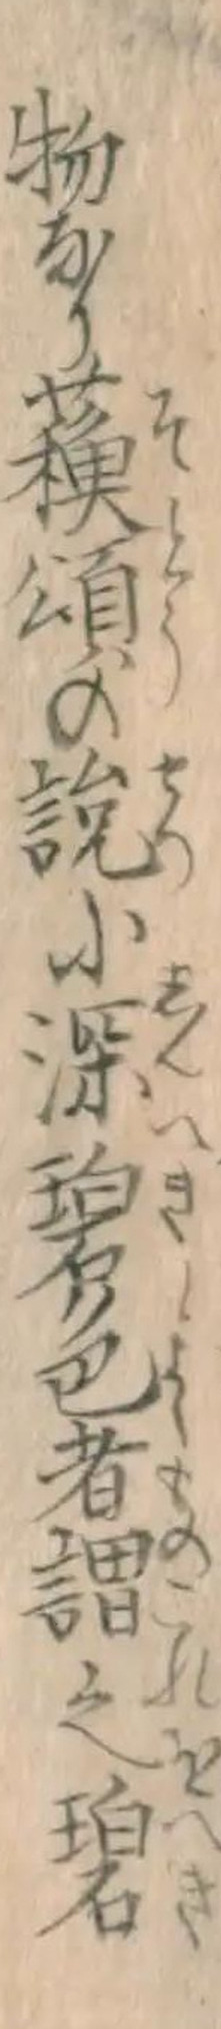物なり蘓頌の説に深碧色者謂之碧
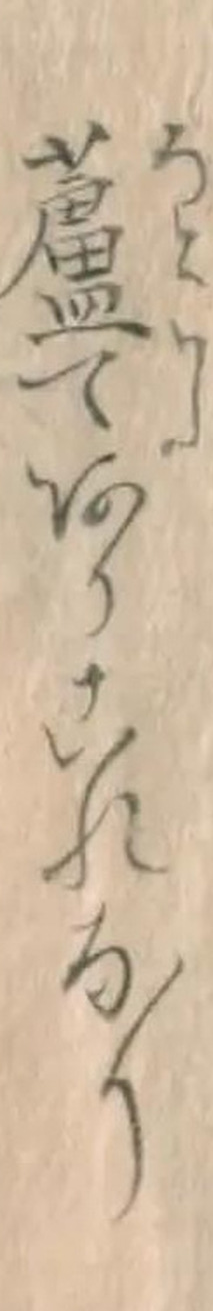蘆てありこれなり

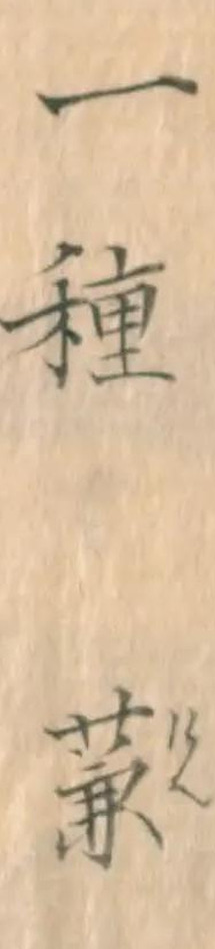一種蒹
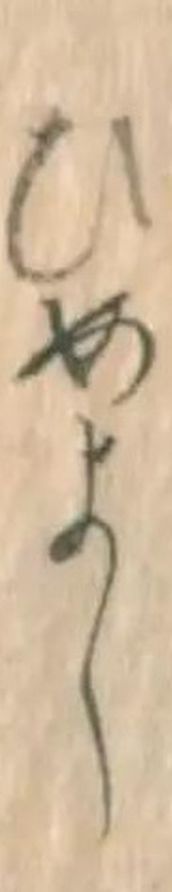ひめよし
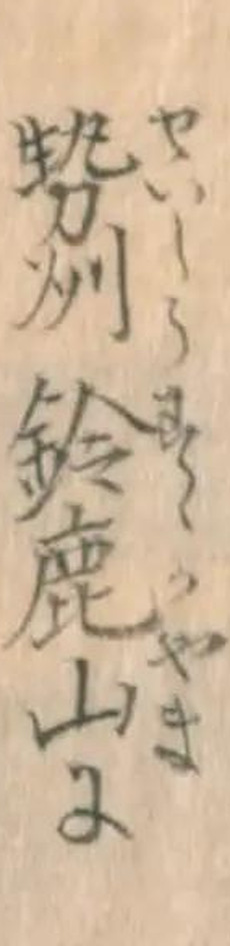勢州鈴鹿山に
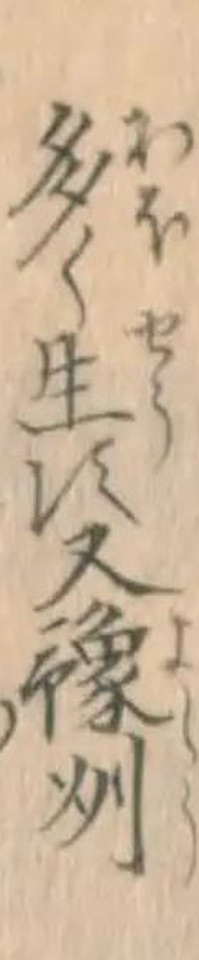多く生す又豫州
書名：本草図譜. 巻16-18
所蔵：国立国会図書館 National Diet Library, JAPAN
